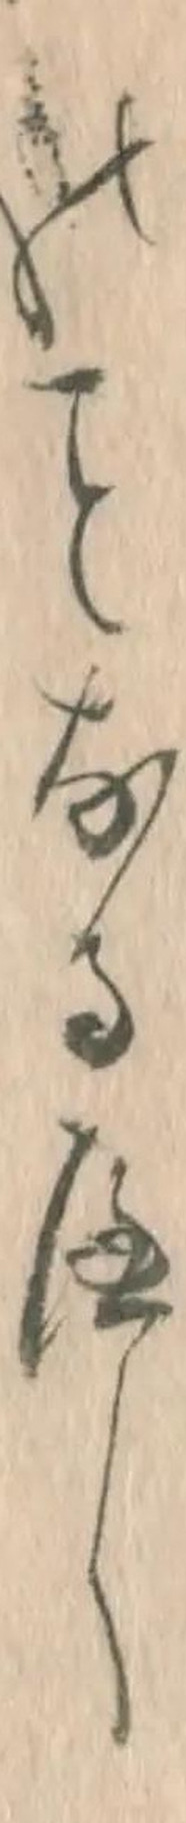のことなるへし
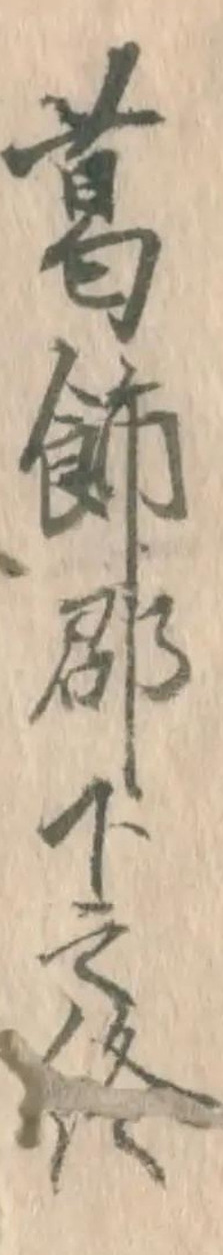葛飾郡下之終
